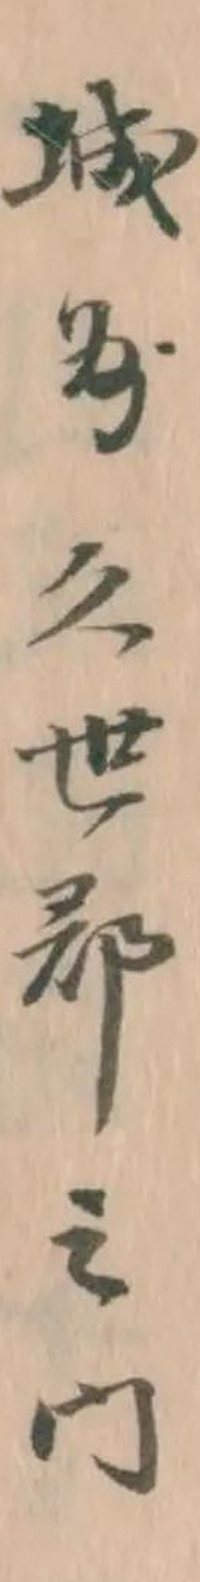城州久世郡之内
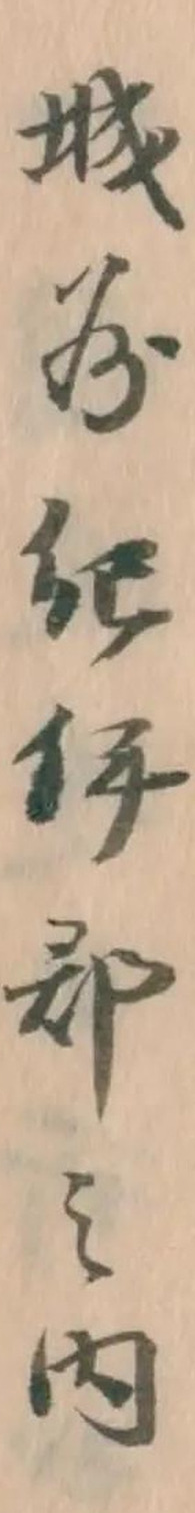城州久世郡之内

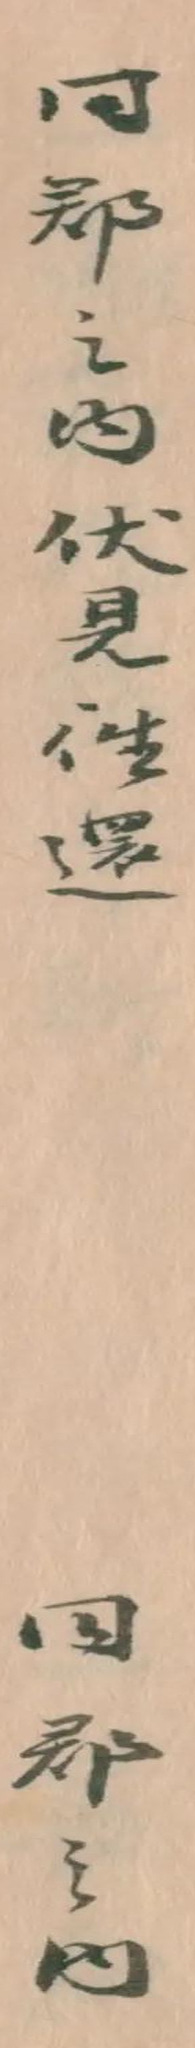同郡之内伏見往還同郡之内
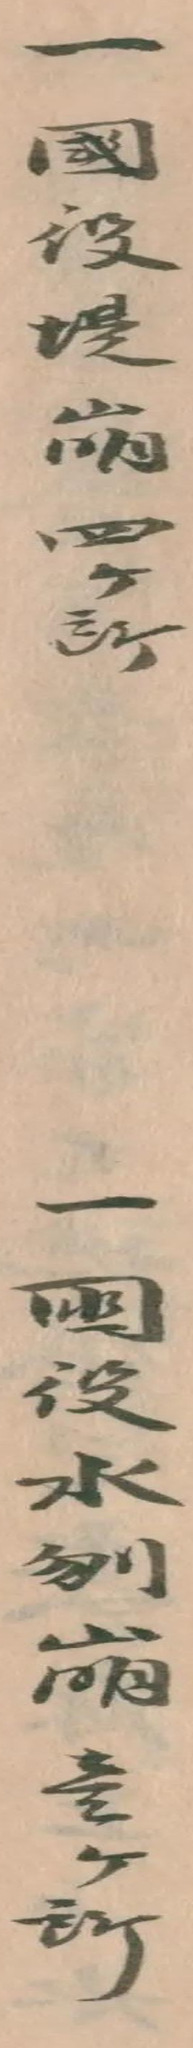国役堤崩四ヶ所一国役水刎崩壱ヶ所
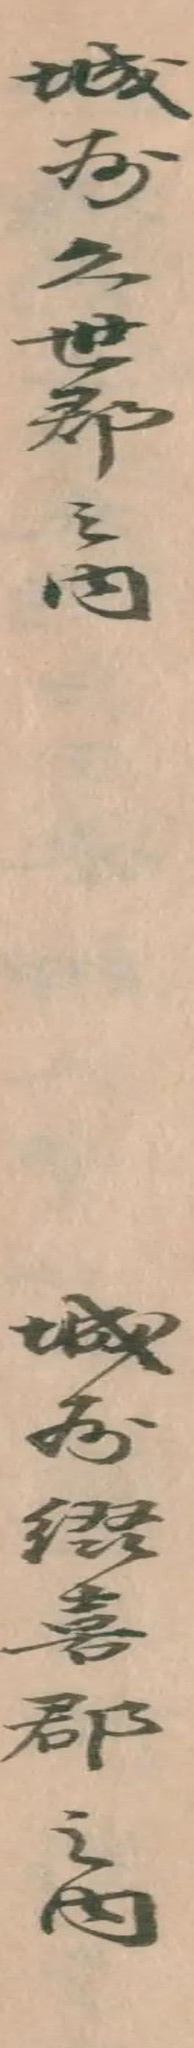城州久世郡之内城州畷喜郡之内
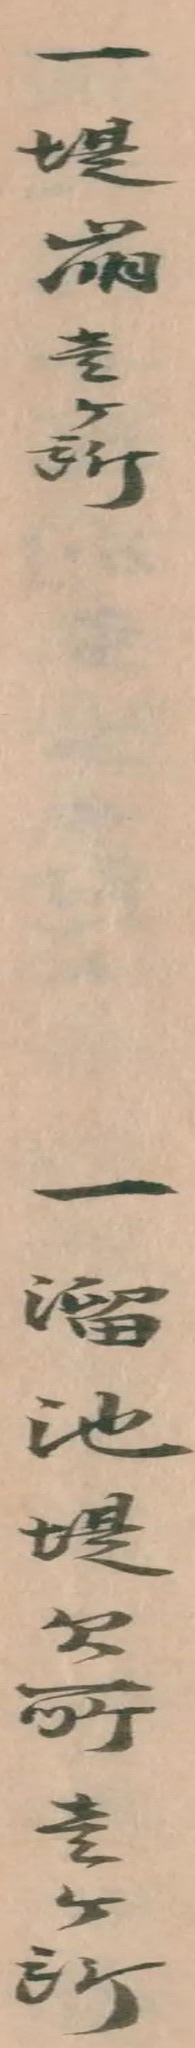一堤崩壱ヶ所一溜池堤欠壱ヶ所
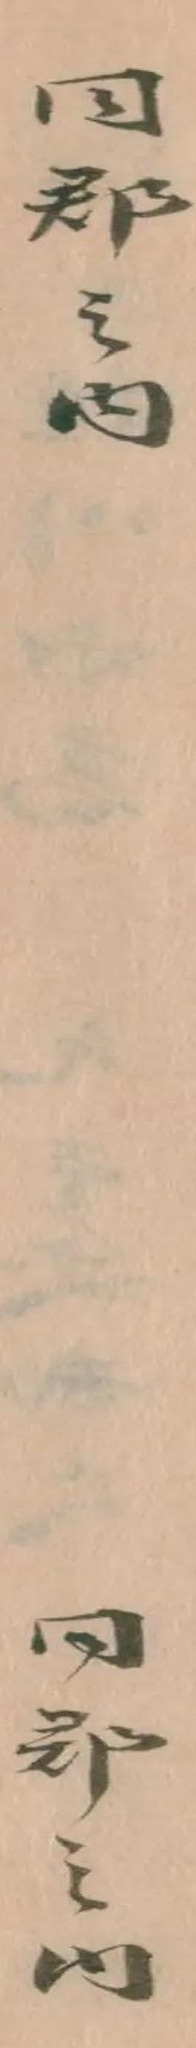同郡之内同郡之内
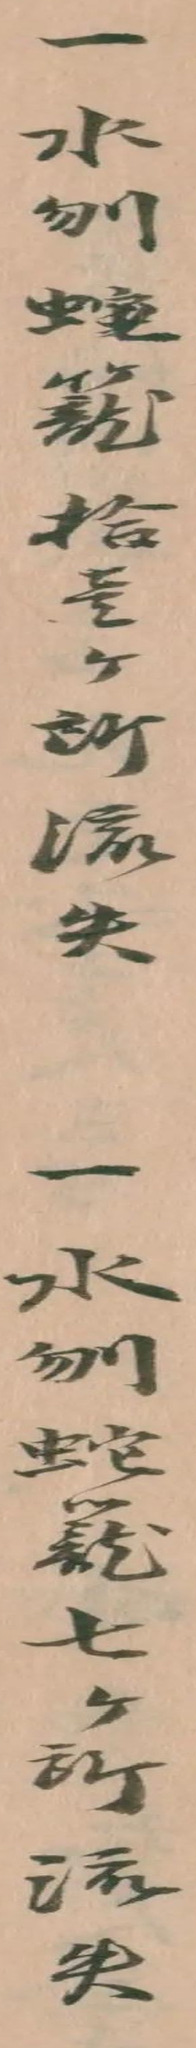一水刎蛇籠拾壱ヶ所流失一水刎蛇籠七ヶ所流失
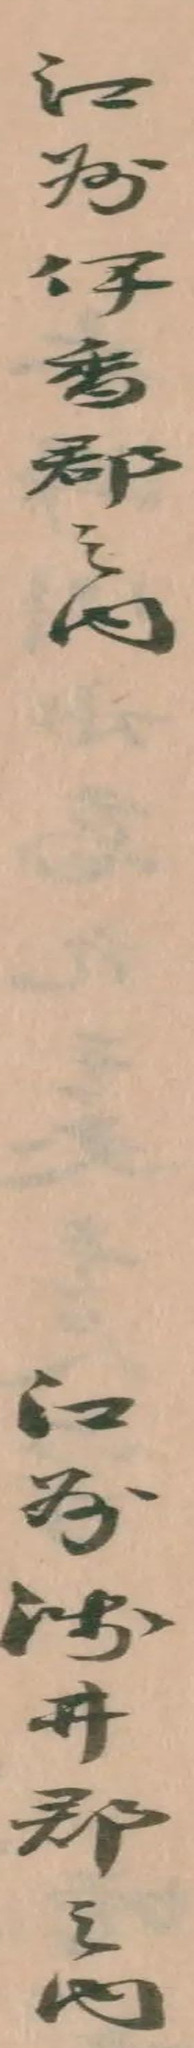江州伊香郡之内江州浅井郡之内
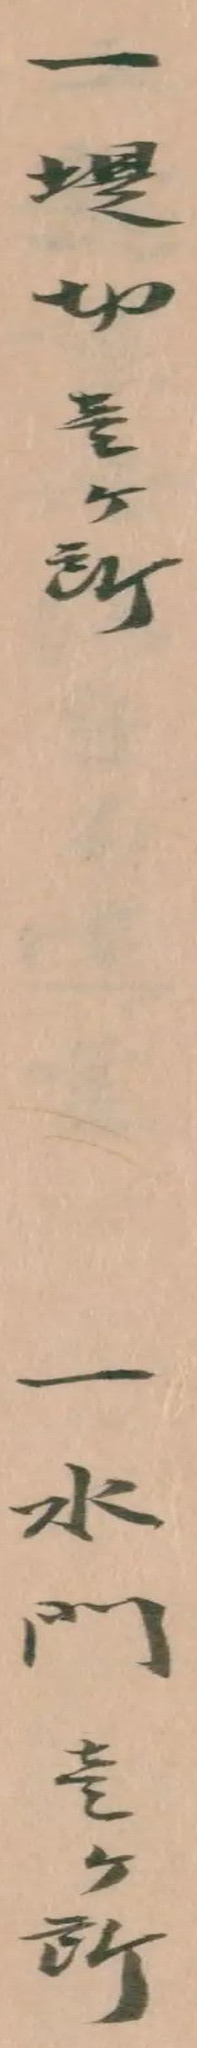一堤切壱ヶ所一水門壱ヶ所
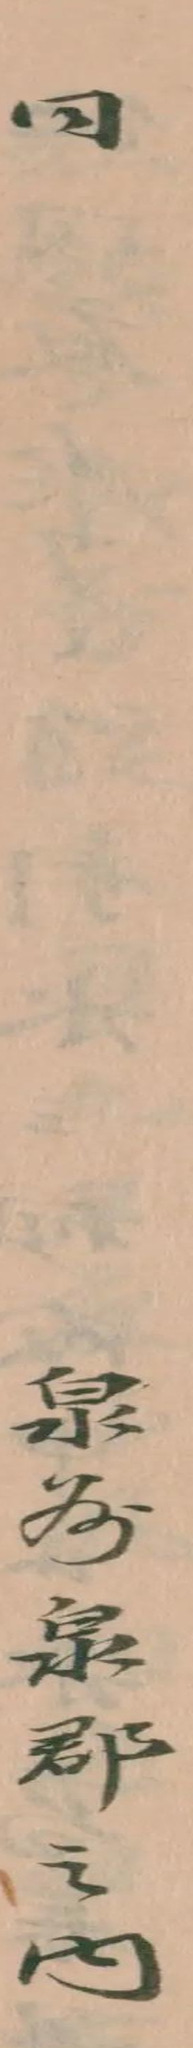同泉州郡之内
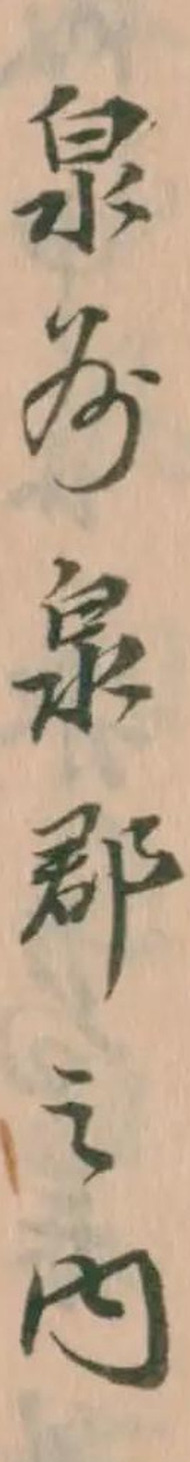同泉州郡之内
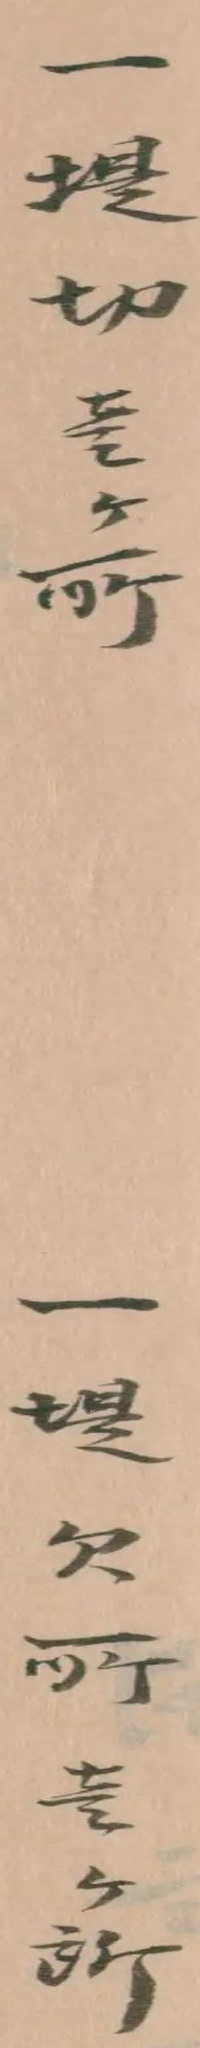堤切壱ヶ所一堤欠所壱ヶ所
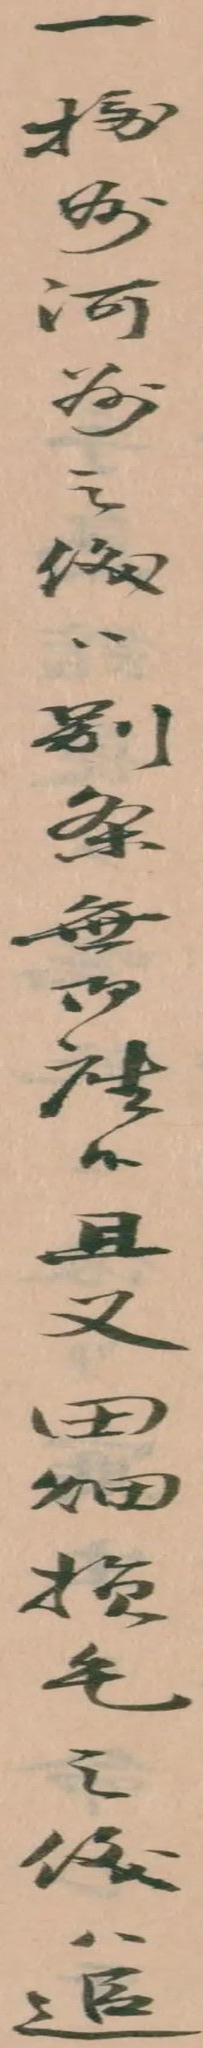攝州河州之儀ハ別条無御座候且又田畑損毛之儀ハ追
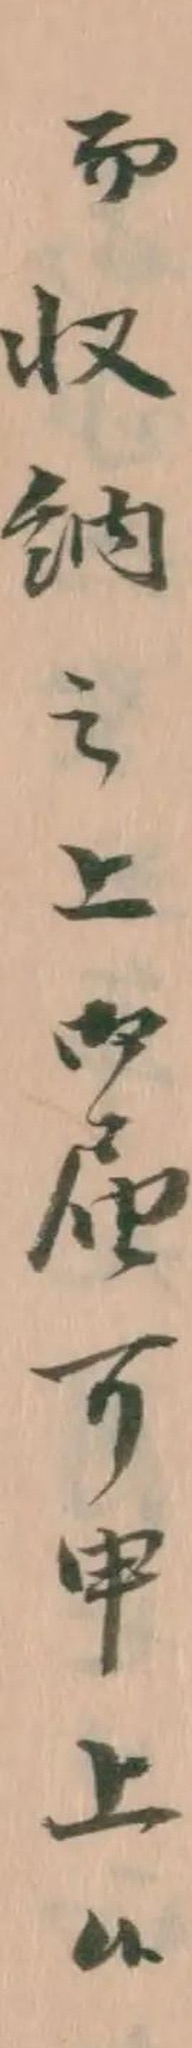而収納之上御届可申上候
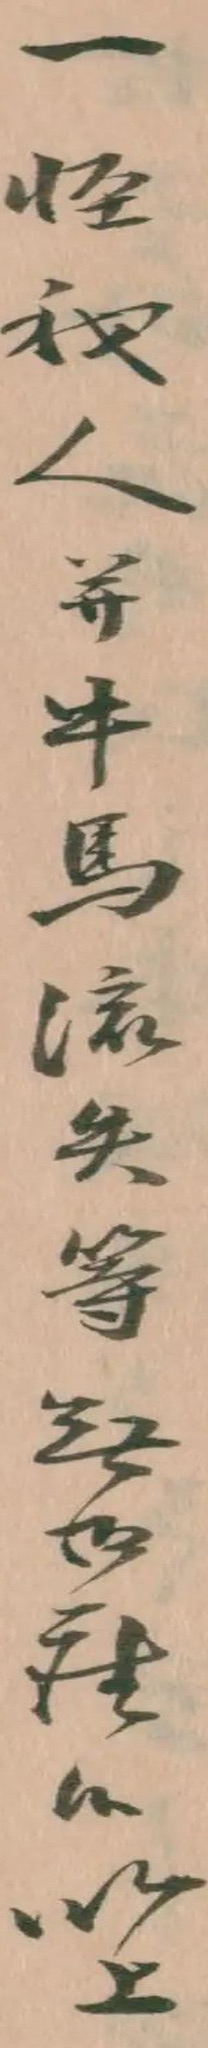一怪我人并牛馬流失等無御座候以上
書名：地災撮要. 巻3(地震之部)-巻4(噴火之部)
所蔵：国立国会図書館 National Diet Library, JAPAN
